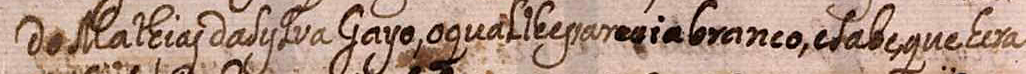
do Mathias da Sylva Gayo, o qual lhe parecia branco, e Sabe que hera
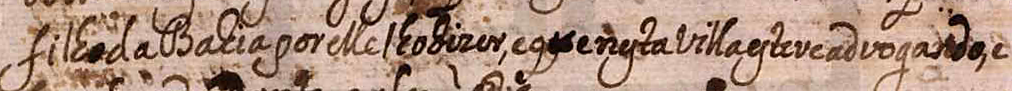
filho da Bahia por elle lho dizer, e que nesta villa esteve advogando, e
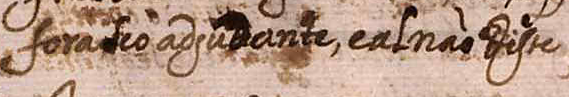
fora seo adjudante, e al naõ disse
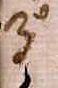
3o
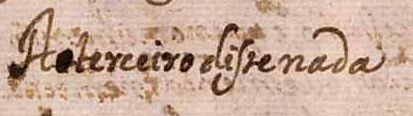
Ao terceiro disse nada
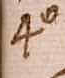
4o
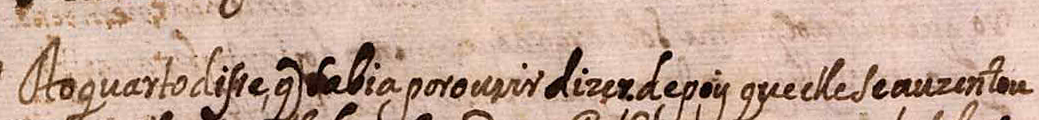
Ao quarto disse, q̄ sabia por ouvir dizer depois que elle se auzentou
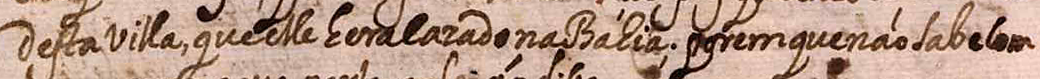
desta villa, que elle hera cazado na Bahia; porem que naõ sabe com
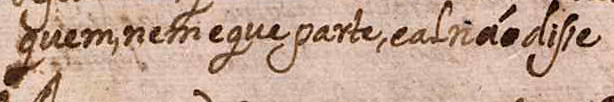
quem, nem e que parte, e al não disse.
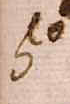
5o
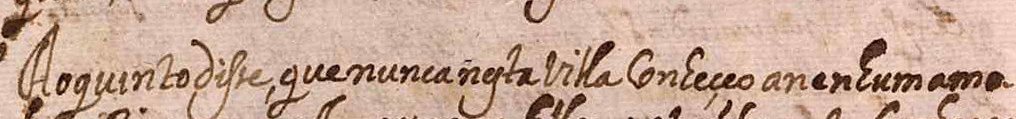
Ao quinto disse, que nunca nesta Villa conheceo a nenhuma mo
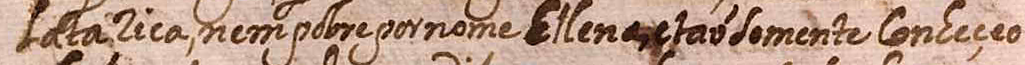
lata Rica, nem pobre por nome Ellena, e taõ somente conheceo
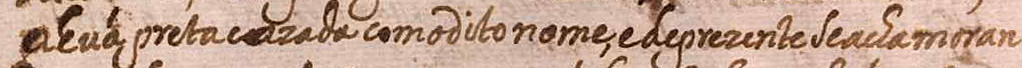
a huā preta cazada com o dito nome, e de prezente se acha moran
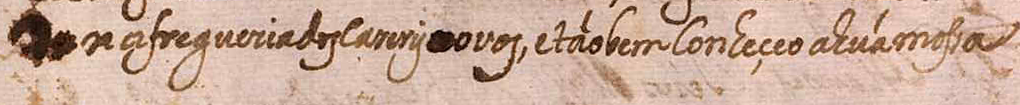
do na freguezia dos carery _ovos, e taõbem conheceo a huā mossa
